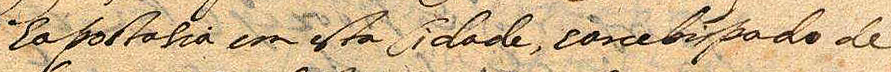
E apostasia em esta Cidade, E arcebispado de
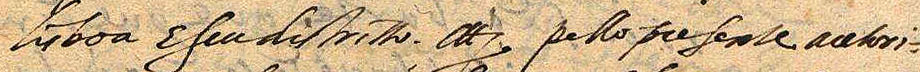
lisboa E seu distritto, ettꝭ pello presente autori
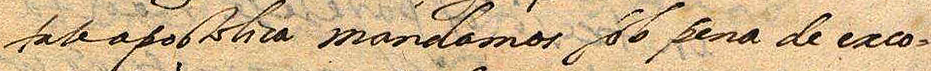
tate apostolica mandamos sob pena de exco
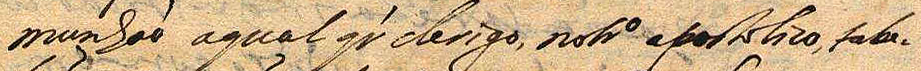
munhaõ a qualqr̄ clerigo, notro apostolico, tabe
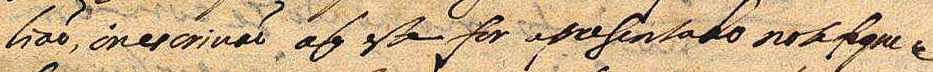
liaõ, ou escriuaõ a q̄ este for apresentado notefique
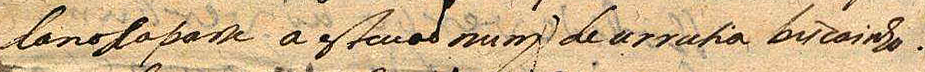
da nossa parte a esteuaõ nunz̄ de urrutia biscainho
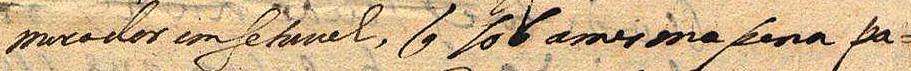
morador em setuuel, q̄ sob a mesma pena pa
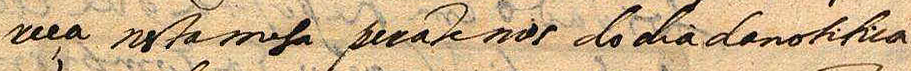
reça nesta mesa perāte nos do dia da notifica
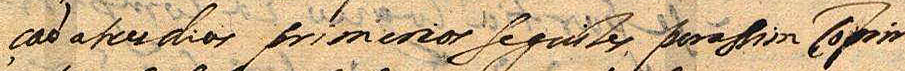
çaõ a tres dias primeiros seguītes per assim cōprir
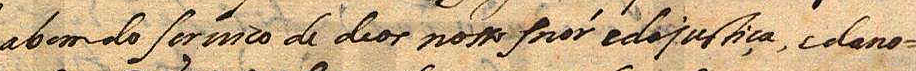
a bem do seruico de deos nosso snor̄ e da justiça, e da no
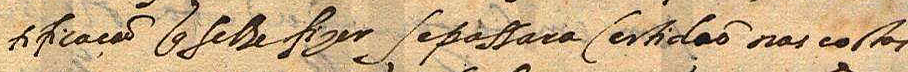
tificaçaõ q̄ se lhe fizer se passara Certidaõ nas costas
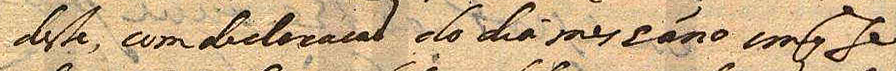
deste, com declaracaõ do dia mes E an̄o em q̄ se
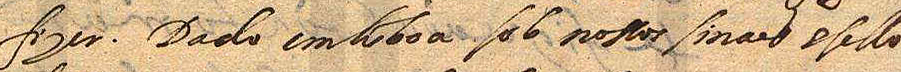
fizer. Dado em lisboa sob nossos sinaes E sello
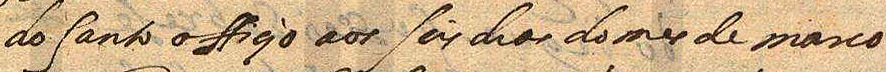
do santo officjo aos seis dias do mes de marco
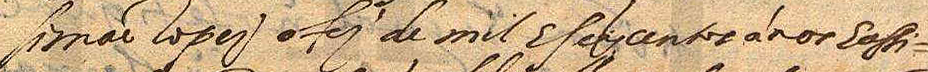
simaõ lopez o fez de mil E seiscentos an̄os E assi
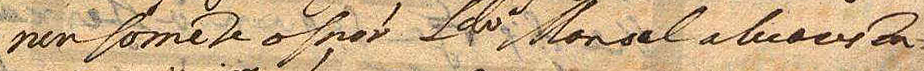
nou somēte o snor̄ L.do Manoel aluares ta
